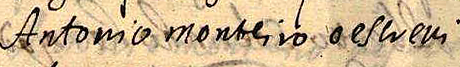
Antonio monteiro o escreui
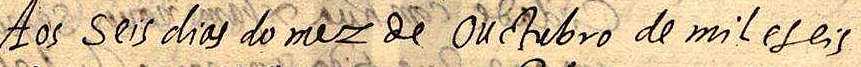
Aos seis dias do mez de Octubro de mil e seis
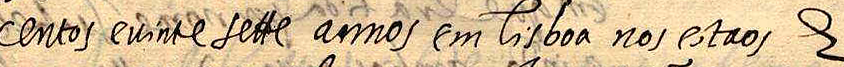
centos e uinte sette annos em lisboa nos estaos E
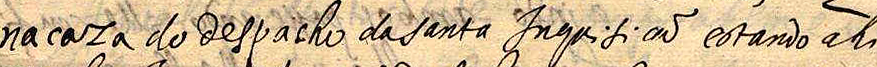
na caza do despacho da santa Jnquisicaõ estando ahi
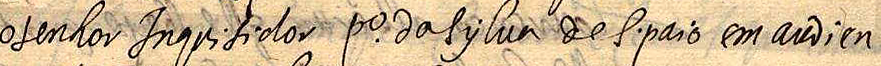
o senhor Jnquisidor p.o da sylua de s.paio em audien
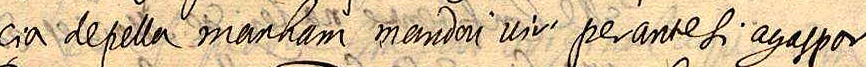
çia de pella manham mandou uir perante si a gaspar
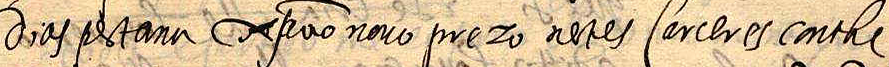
dias pestana xpão nouo prezo nestes Carceres conthe
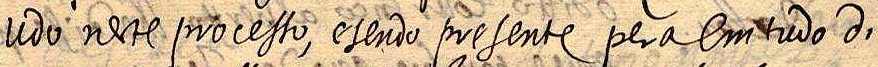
udo neste processo, e sendo presente pera em tudo di
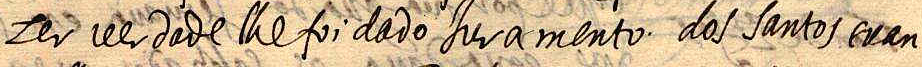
zer uerdade lhe foi dado Juramento dos santos euan
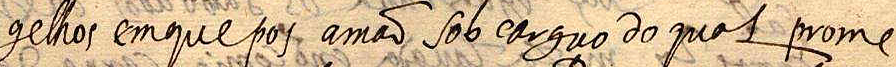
gelhos em que pos a maõ sob carguo do quaL prome
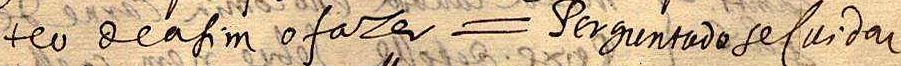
teo de asim o fazer == Perguntado se Cuidou
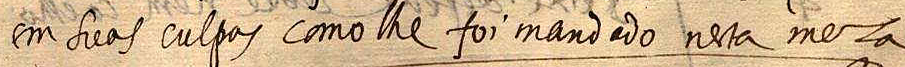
em suas culpas como lhe foi mandado nesta meza
